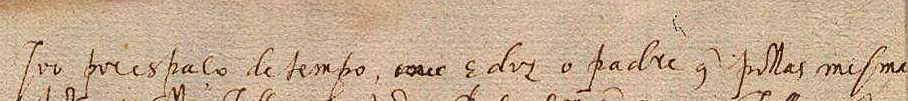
soo por espaço de tempo, _ E diz o padre q̄ pellas mesma
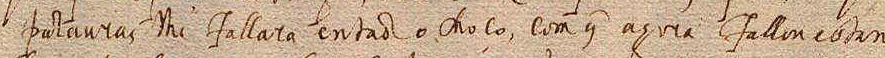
palauras lhe fallara entaõ o Moço, com q̄ agora fallou estan
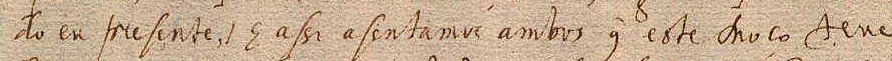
do eu presente, / E assi asentamos ambos q̄ este Moço teue
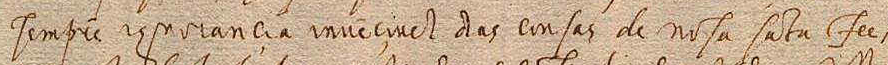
sempre ignorancia inuēciuel das cousas de nossa sāta fee,
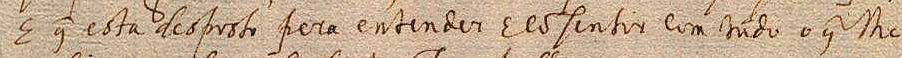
E q̄ esta desposto pera entender E cōsentir com tudo o q̄ lhe
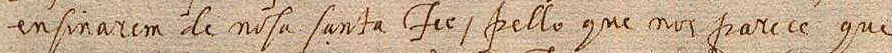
ensinarem de nosa santa fee / pello que nos parece que
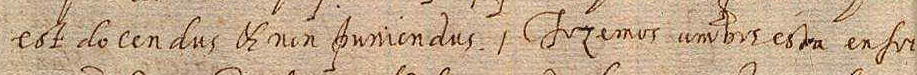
est docendus & non puniendus / fizemos ambos esta enfor
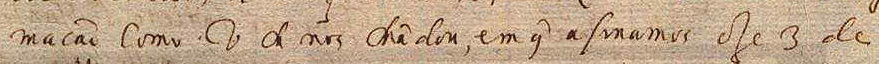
mação como V A nos Mādou em q̄ asinamos oJe 3 de
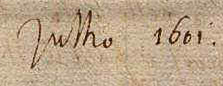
Julho 1601.
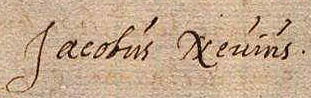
Jacobus Neuins.
